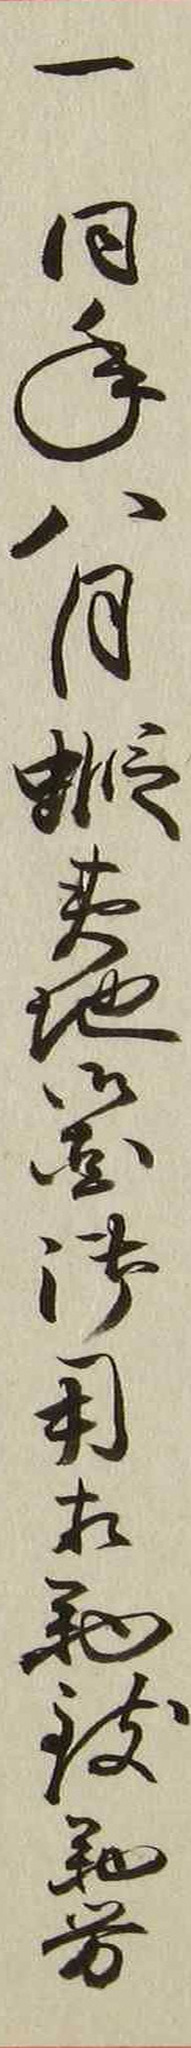一同年八月蝦夷地御固御用相勤致勤労
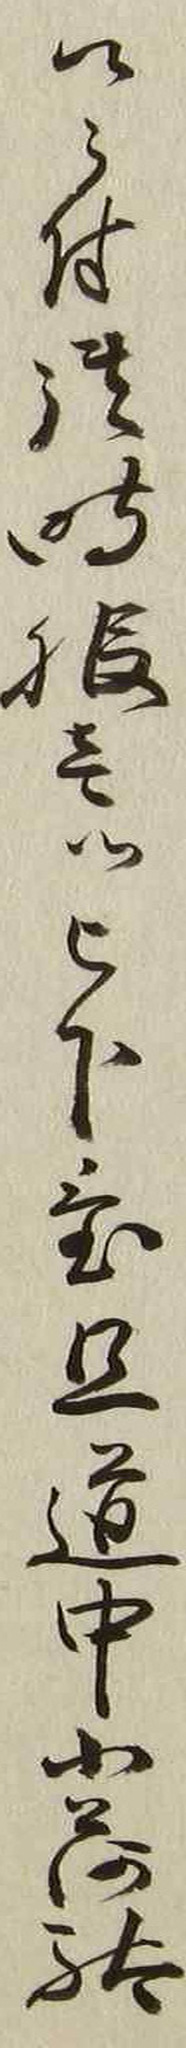候ニ付御時服壱ツ被下置旦道中小荷駄
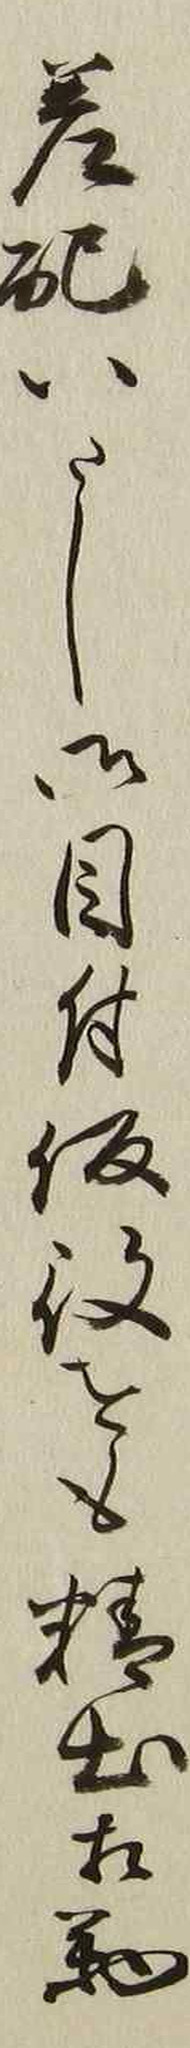差配いたし御目付仮役をも精出相勤
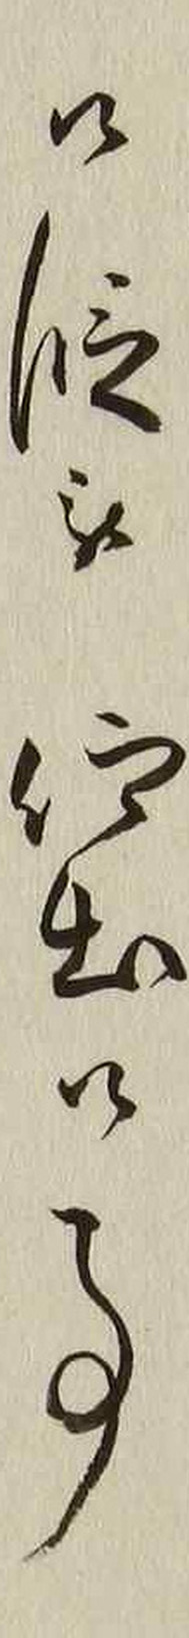候段被仰出候事
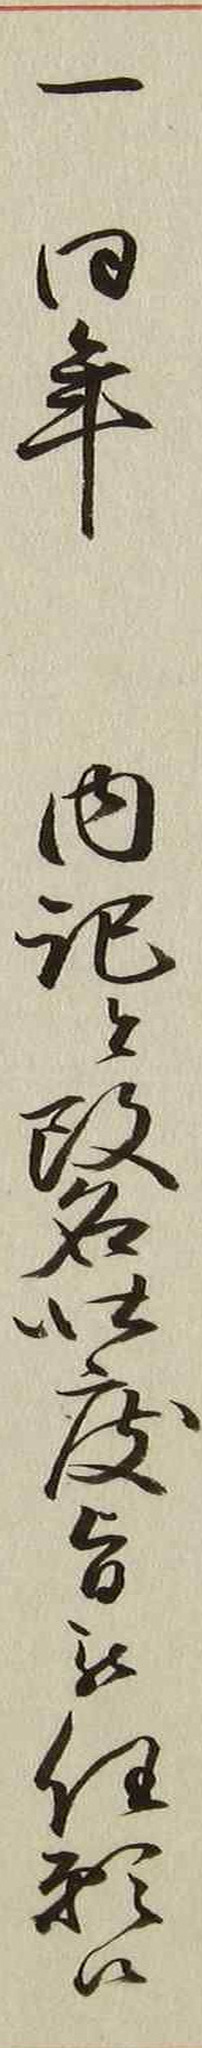一同年内記と改名仕度旨被任願候
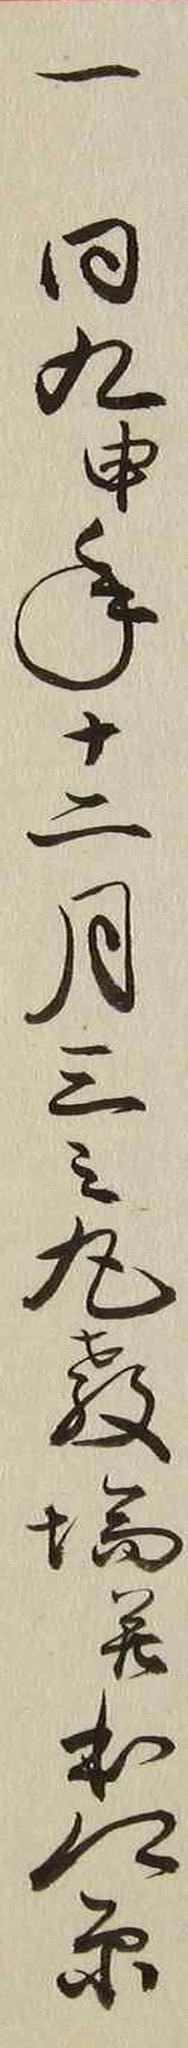一同九申年十二月三之丸教場并本郷原
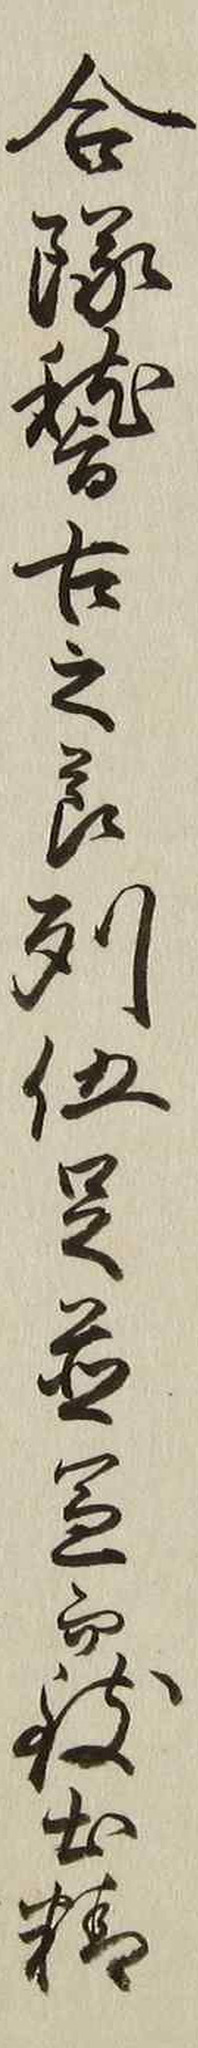合隊稽古之節列伍足並宣而致出精
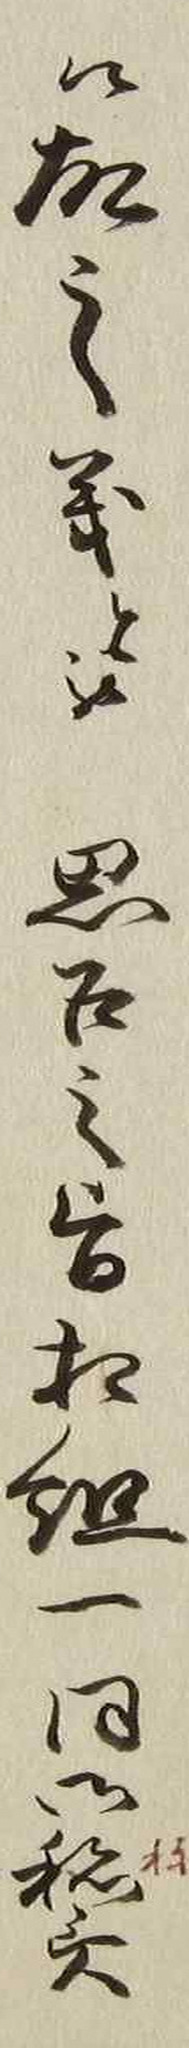侯故之義と被思召之旨相組一同御称美
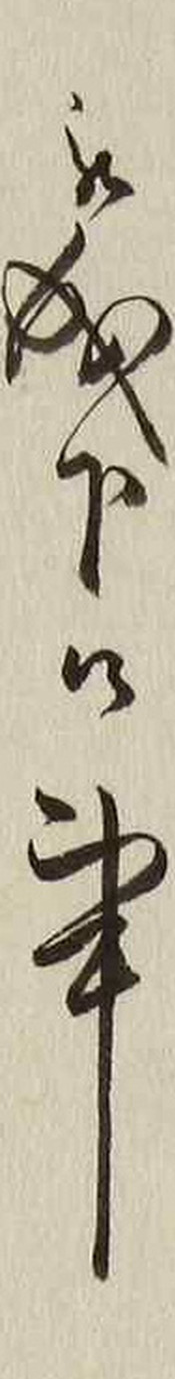被成下候事
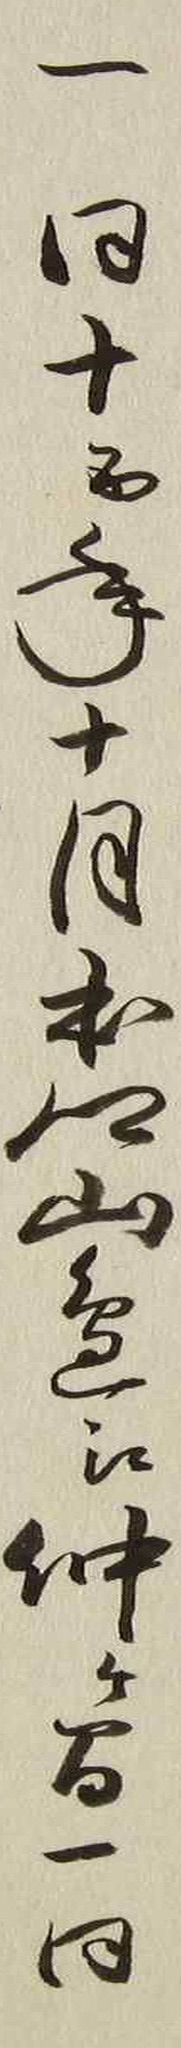一同十酉年十月本郷山辺江仲ケ間一同
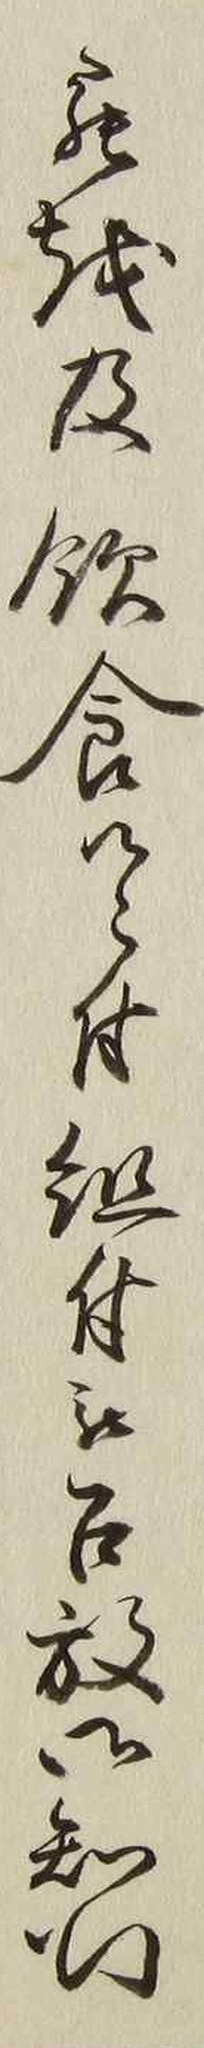罷越及飲食候ニ付組付被召放御知行
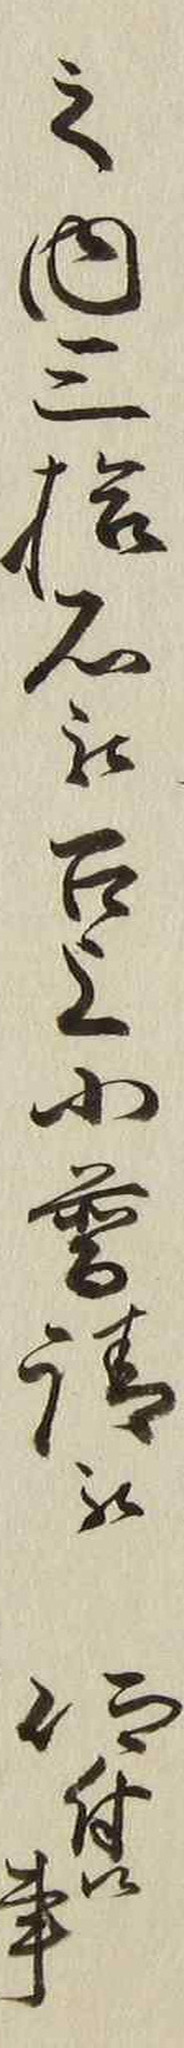之内三拾石被召上小普請被仰付候事
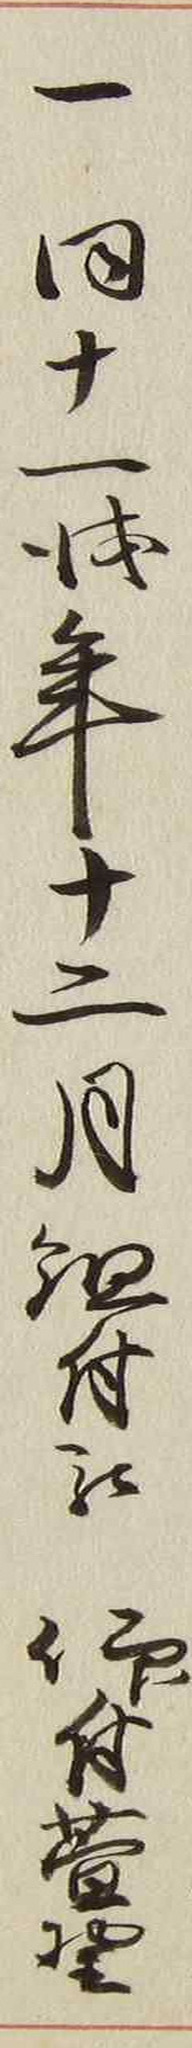一同十一戌年十二月組付被仰付萱野
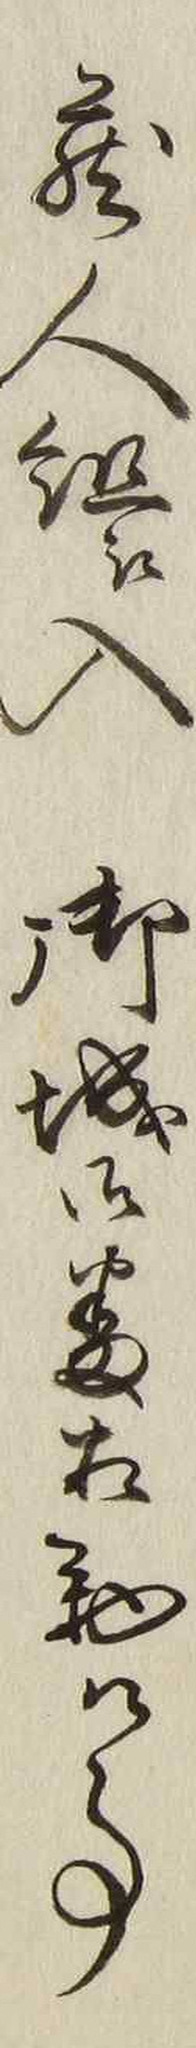蔵人組江入御城御番相勤候事
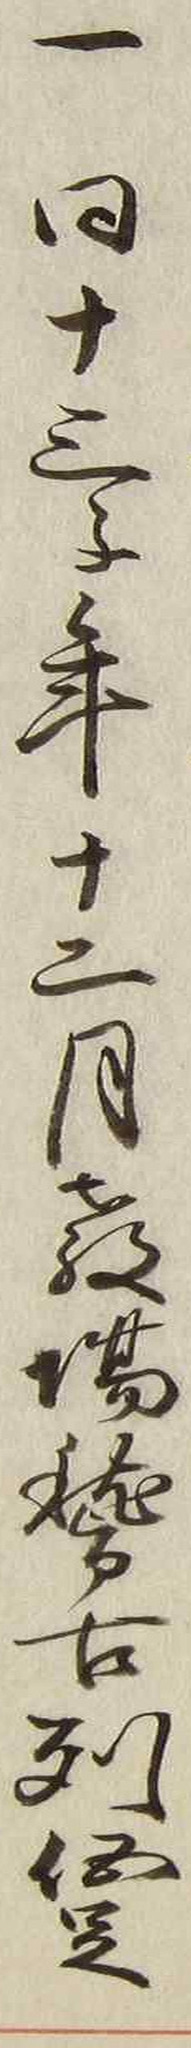一同十三子年十二月教場稽古列伍足
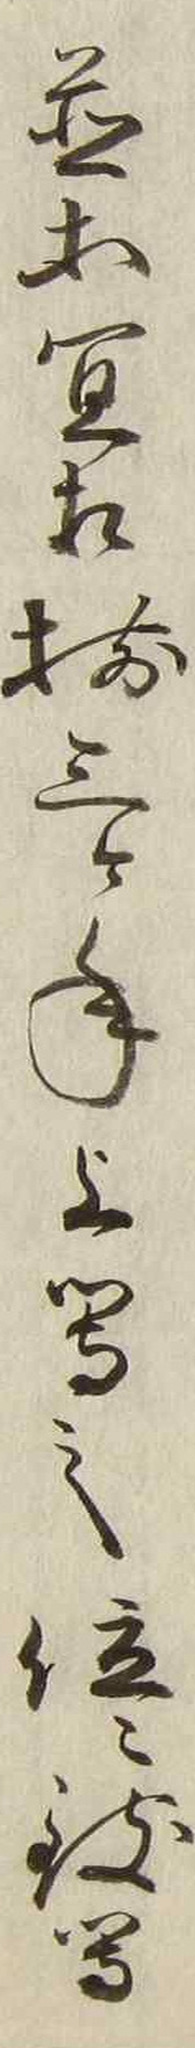並等宜相揃三ケ年上等之位ニ致等
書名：諸士系譜　巻之21　い之部21
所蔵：会津若松市立会津図書館
